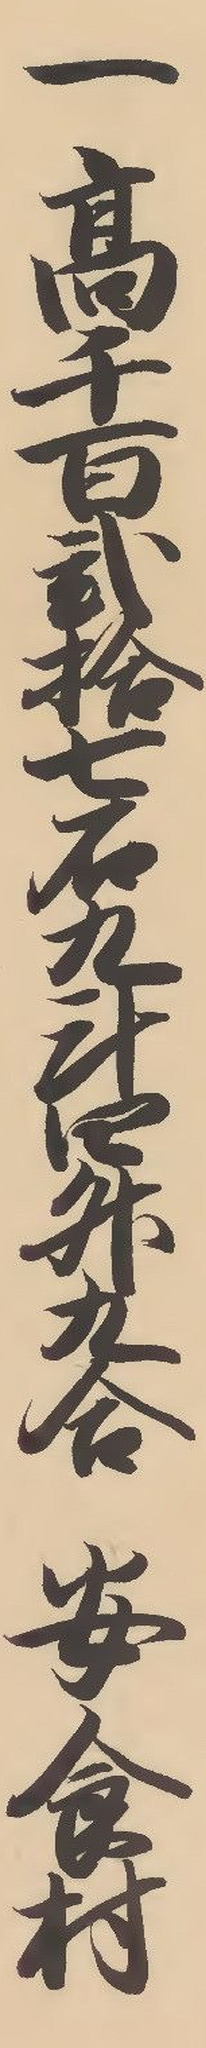一高千百弐拾七石九斗四升九合安食村
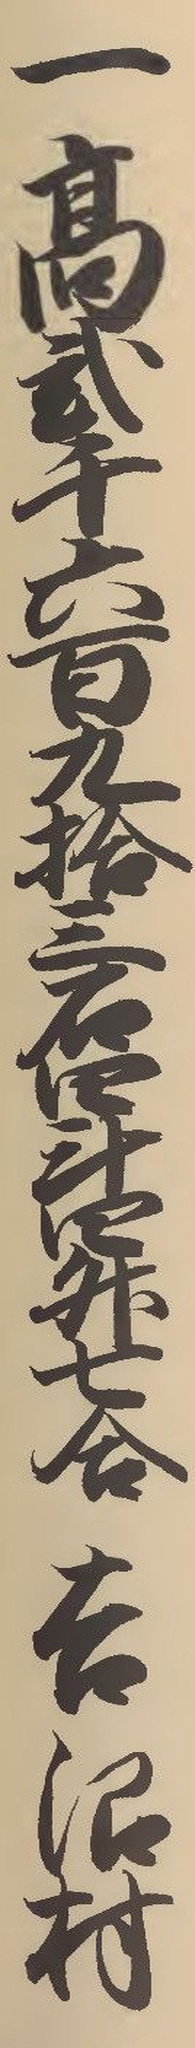一高弐千六百九拾三石四斗四升七合吉沼村
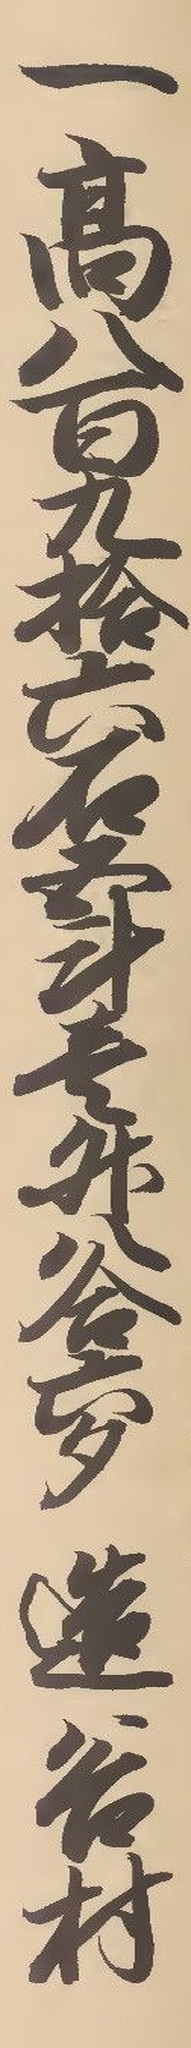一高八百九拾六石五斗壱升八合六勺造谷村
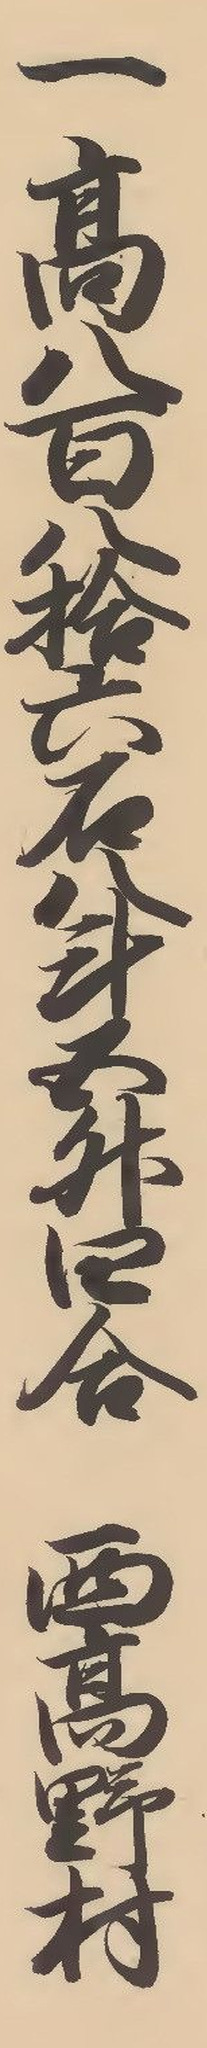一高八百八拾六石八斗五升四合西高野村
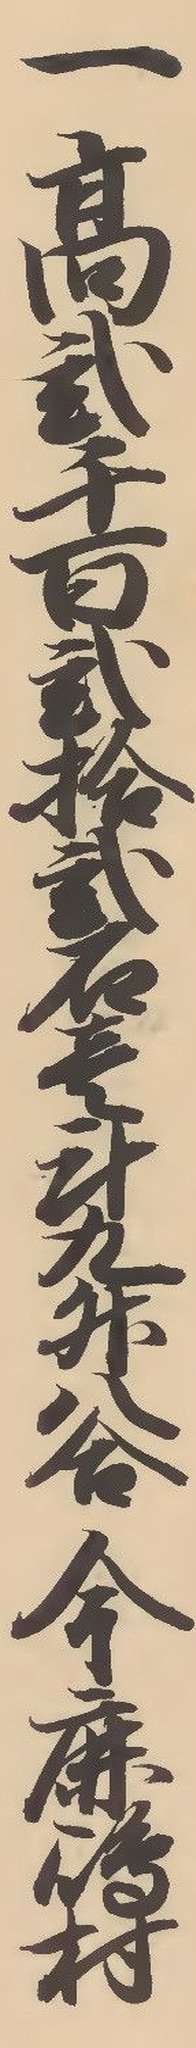一高弐千百弐拾弐石壱斗九升八合今鹿島村
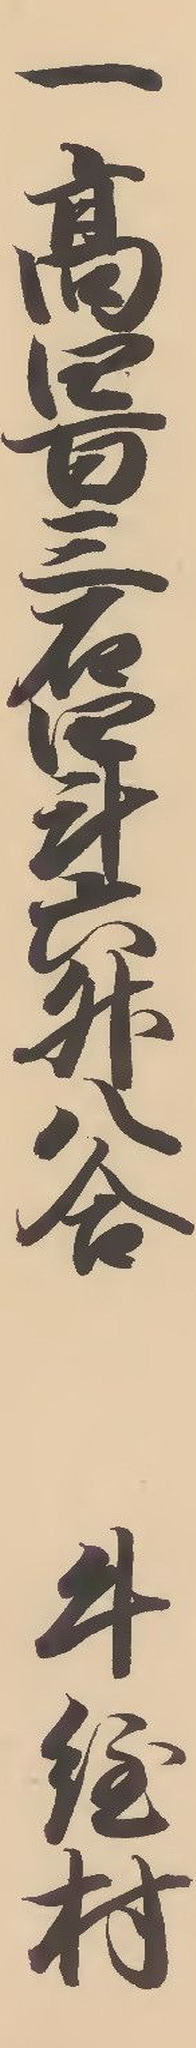一高四百三石四斗六升八合牛縊村

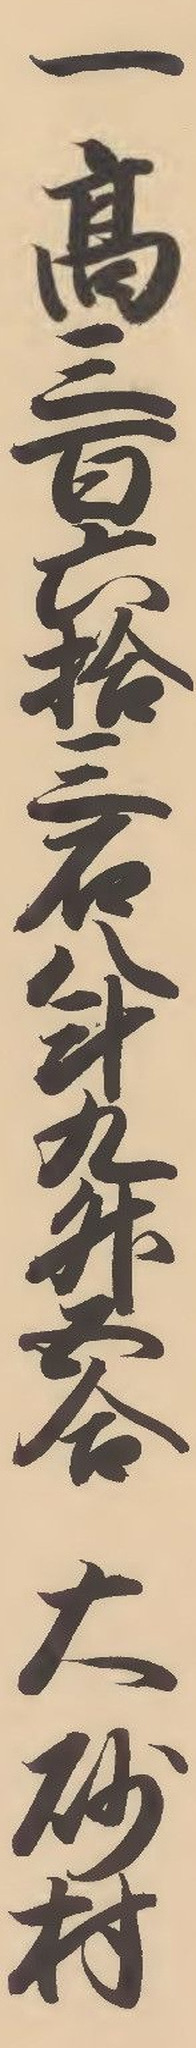一高三百六拾三石八斗九升五合大砂村
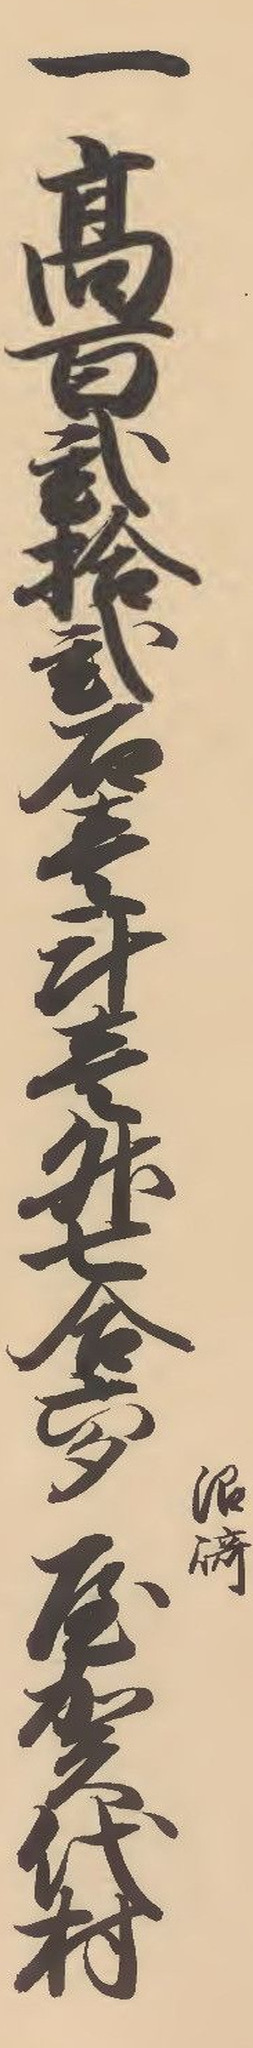一高百弐拾弐石壱斗壱升七合六勺屋賀代村
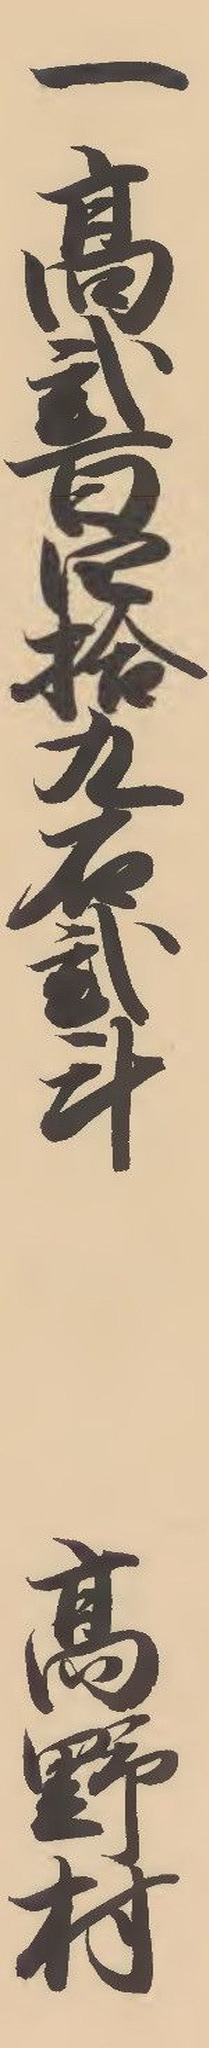一高弐百四拾九石弐斗高野村
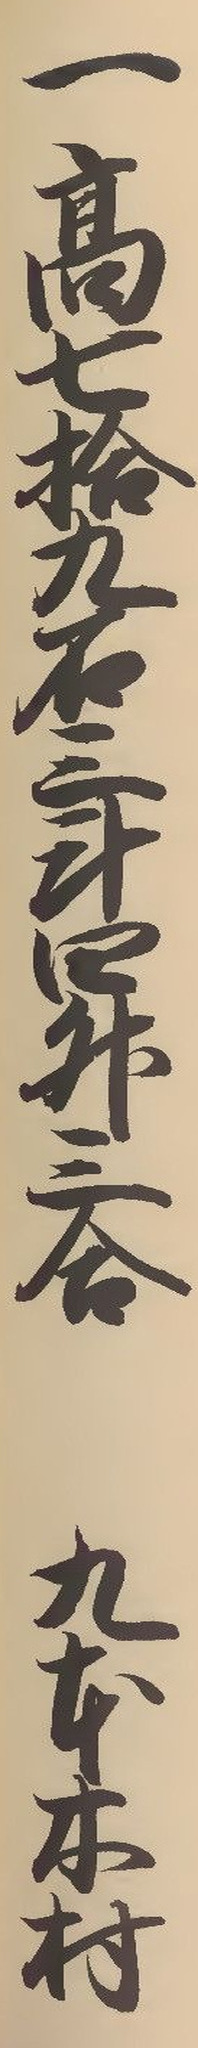一高七拾九石三斗四升三合九本木村
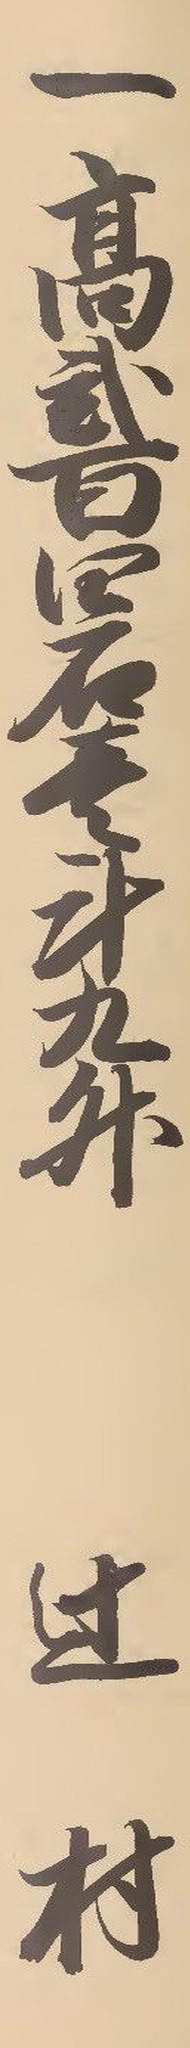一高弐百四石壱斗九升辻村
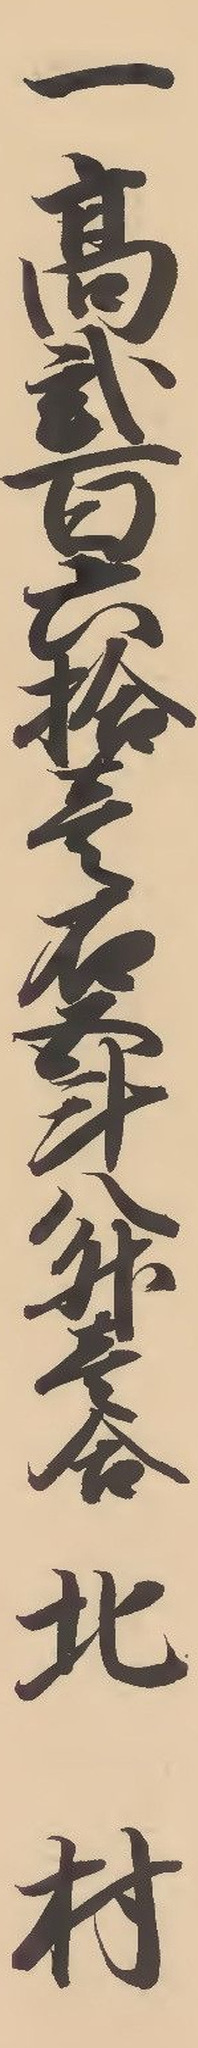一高弐百六拾壱石五斗八升壱合北村
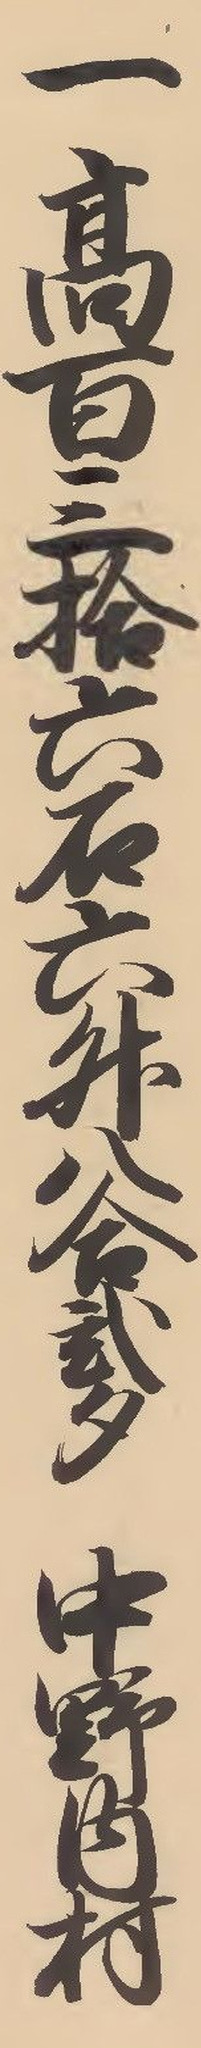一高百三拾六石六升八合弐勺中野内村
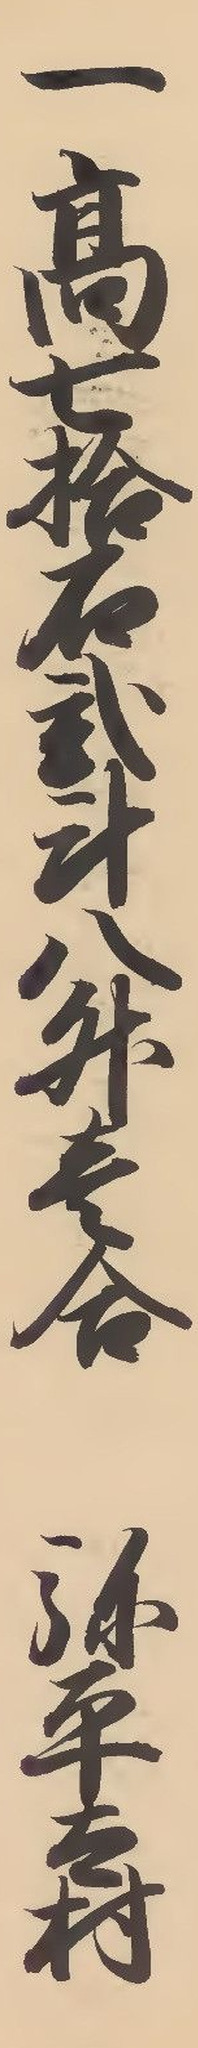一高七拾石弐斗八升壱合弥平太村

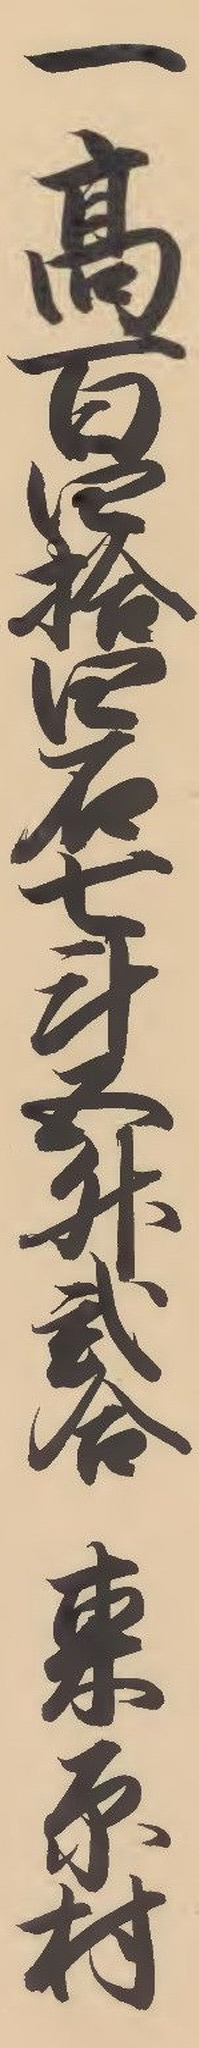一高百四拾四石七斗五升弐合東原村
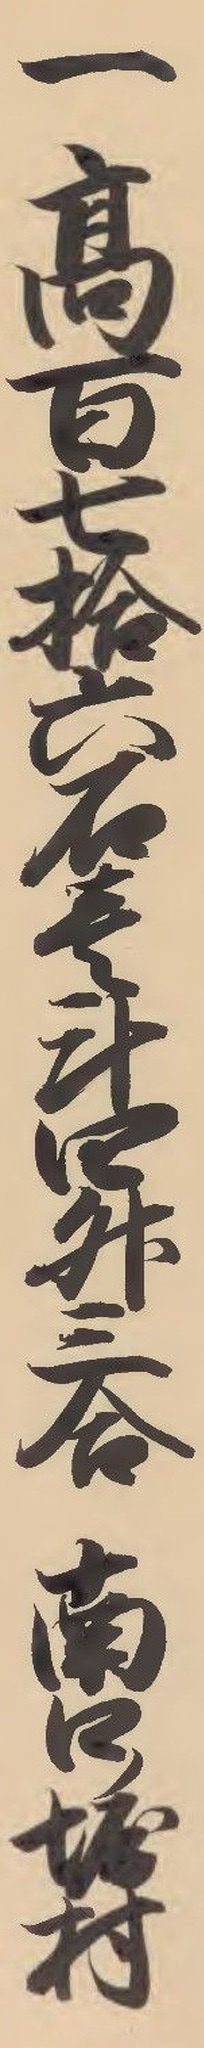一高百七拾六石壱斗四升三合南口堀村
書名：常陸国郷帳
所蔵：国立公文書館 National Archives of Japan
